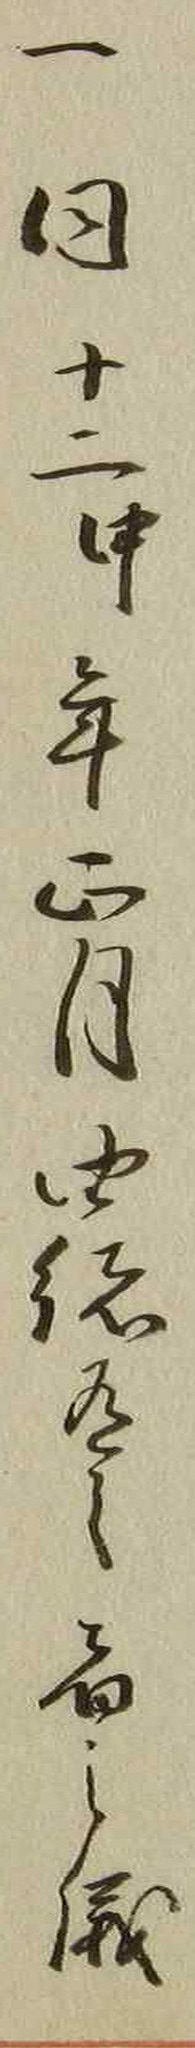一同十二申年正月由緒有之者之儀
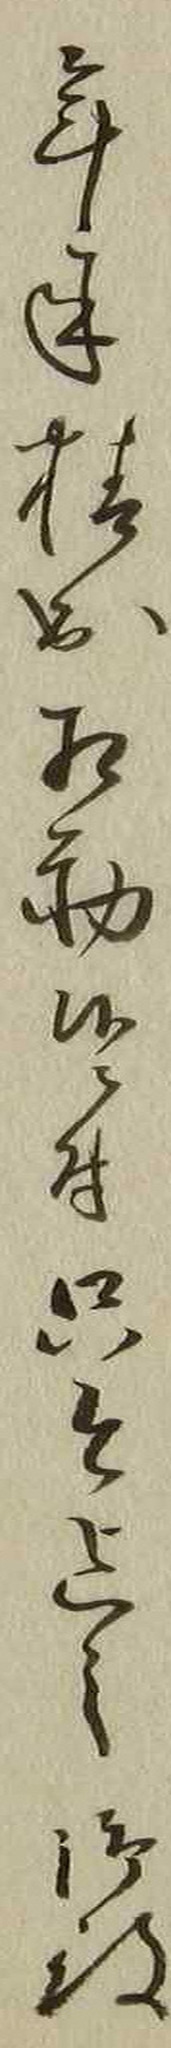年年精出相勤候ニ付只今迄之御役
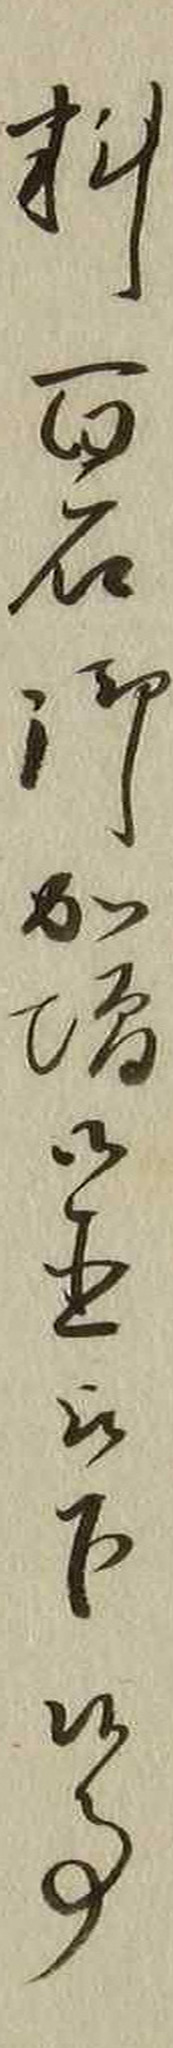料百石御加増御直被下候事
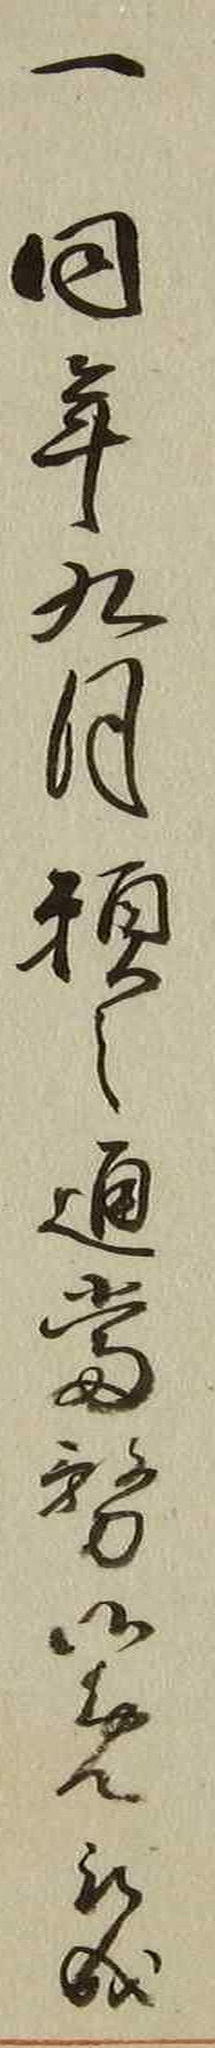一同年九月願之通当務御免被成
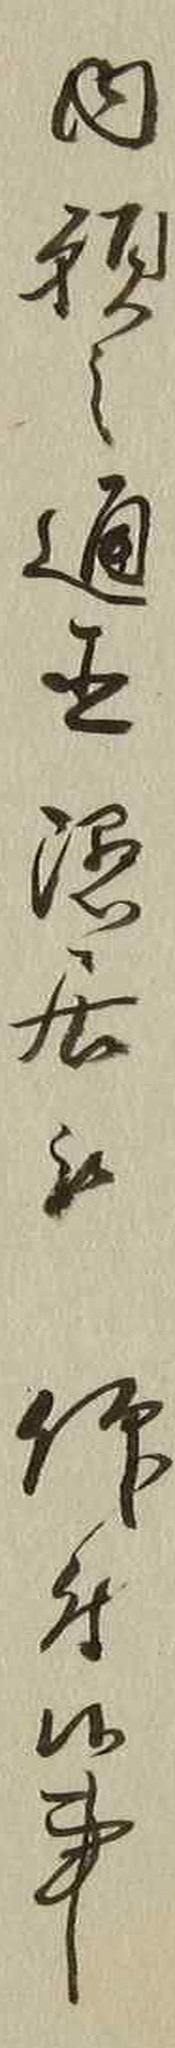内願之通直隠居被仰付候事
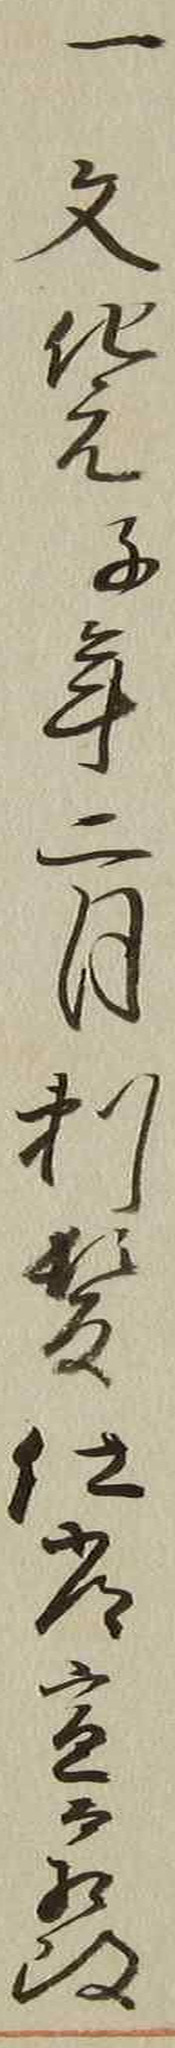一文化元子年二月剃髪仕常宣与相改
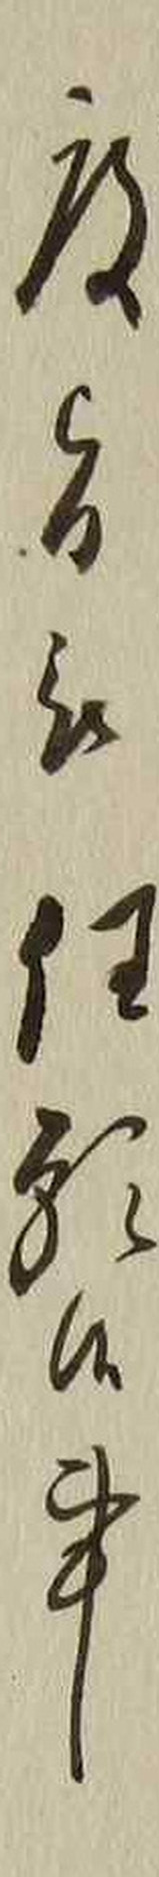度旨被任願候事
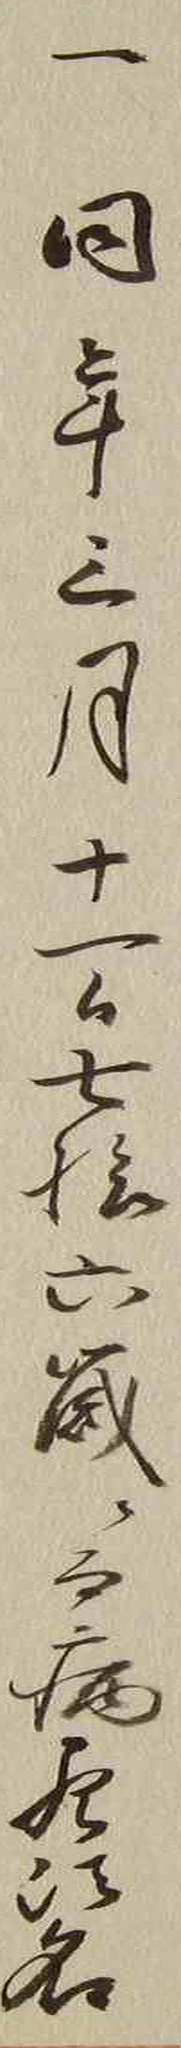一同年三月十一日七拾六歳ニ而病死法名
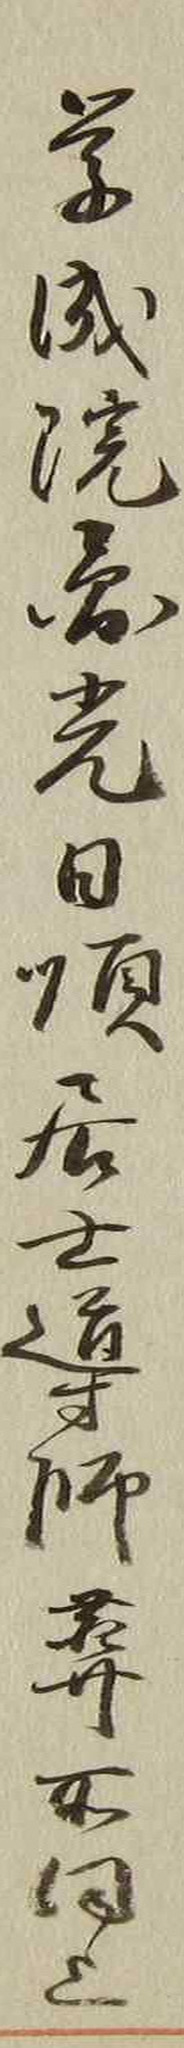学成院円光日順居士導師葬所同上
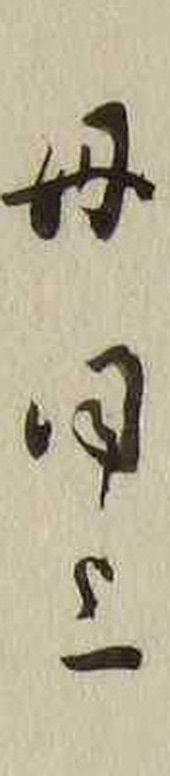母同上
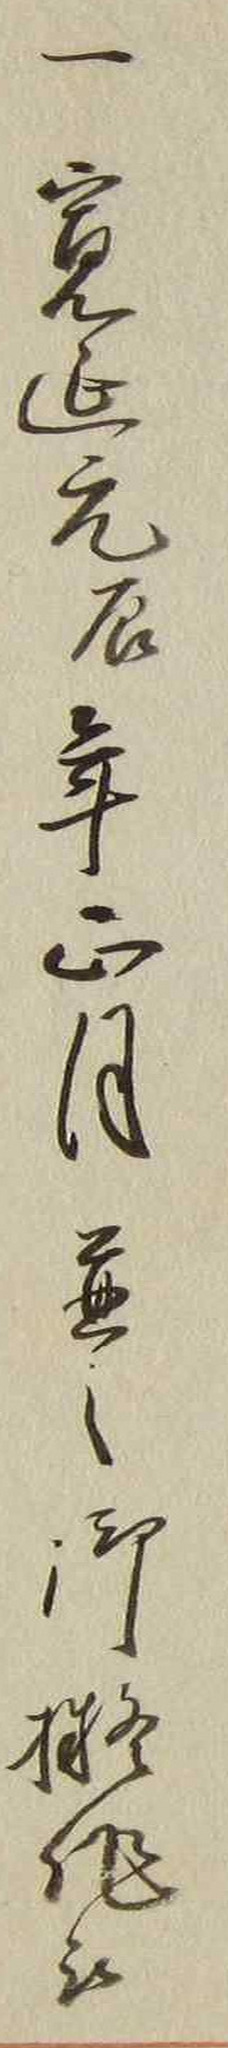一寛延元辰年正月並之御擬作被
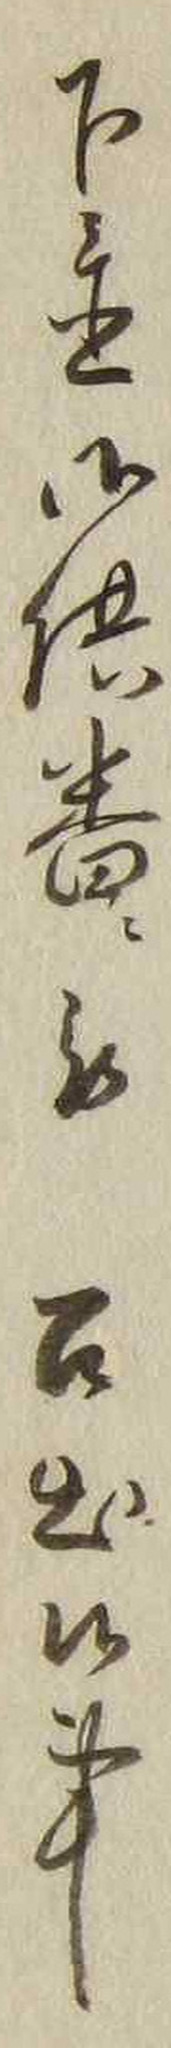下置御供番ニ被召出候事

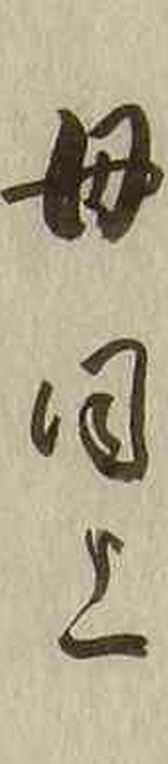母同上
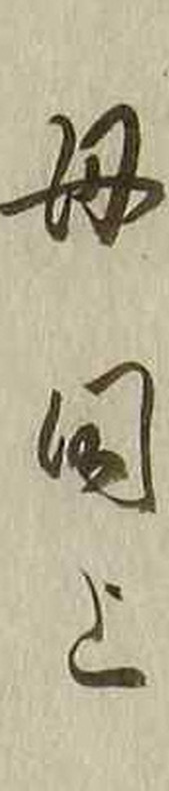母同上
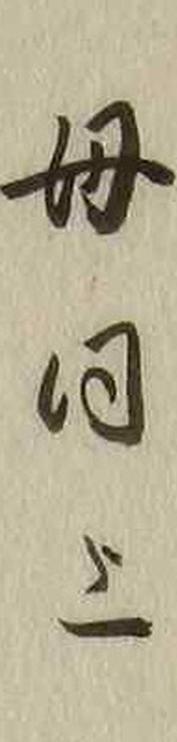母同上
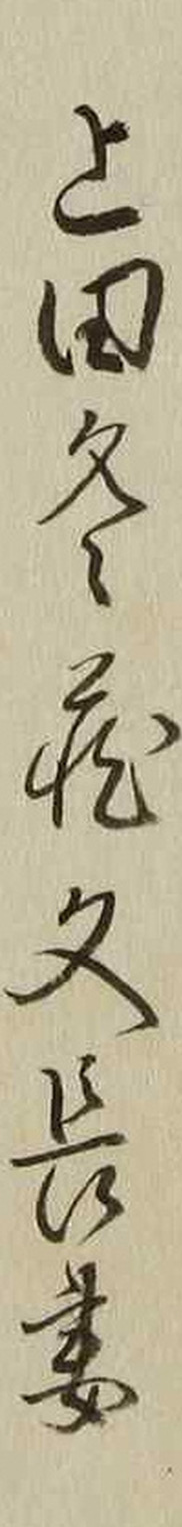上田冬蔵文長妻
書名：諸士系譜　巻之122　よ之部5
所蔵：会津若松市立会津図書館
